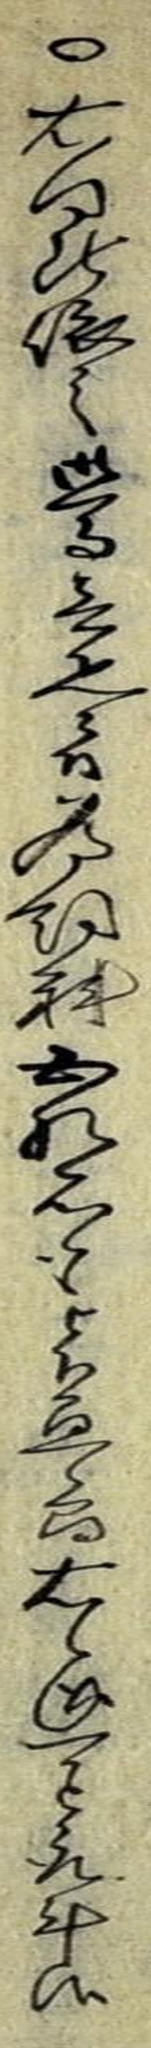〇右同断依之御馬壱疋ニ付為飼料五拾石ツヽ被下置候間右之趣可被取計候
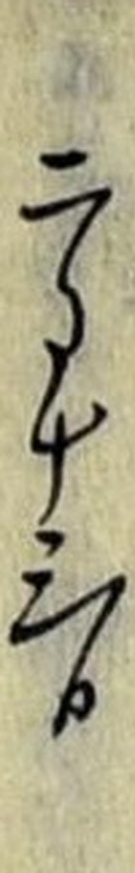二月十三日
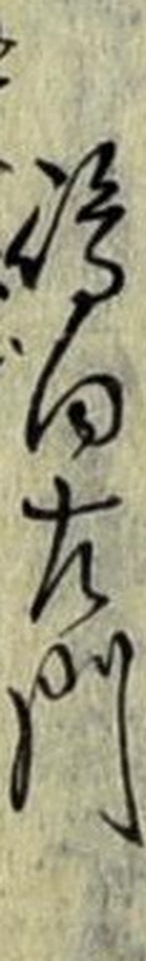嶋田左門
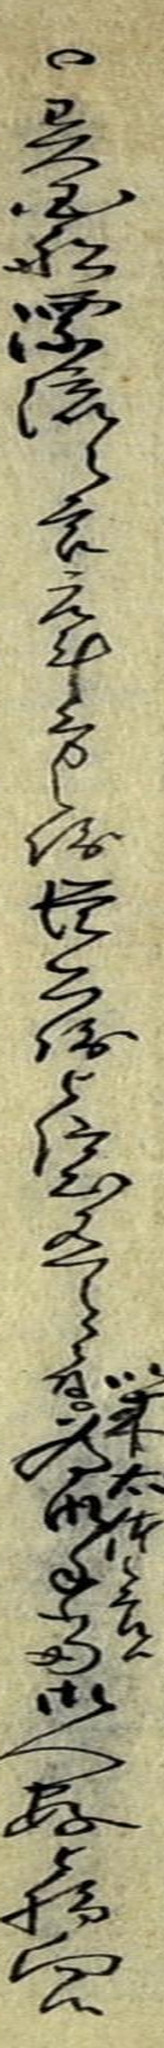〇異国船漂流之節取計方之儀従公儀被仰出有之候ニ付以来右体之節ハ為御手当御人数被指向候
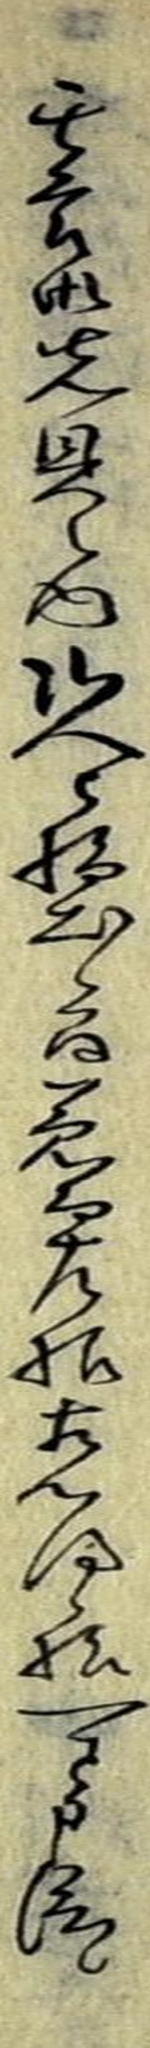其節御先見之内弐人被指出候間兼而左様相心得候様可被申渡候
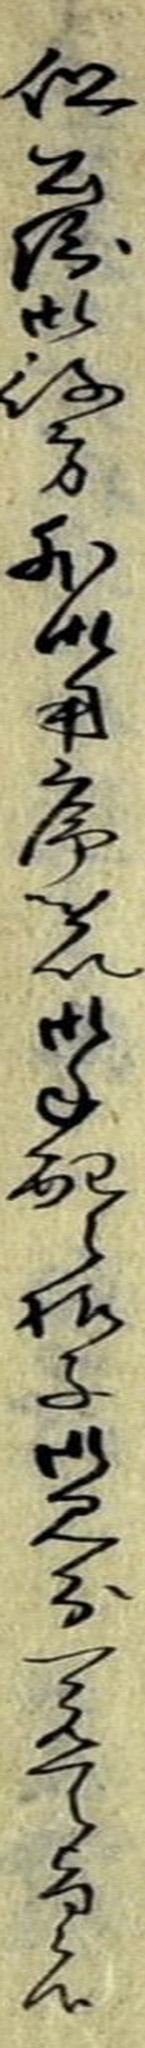但公儀御役方外御用序を以御手配之様子御見分可有之旨ニ候
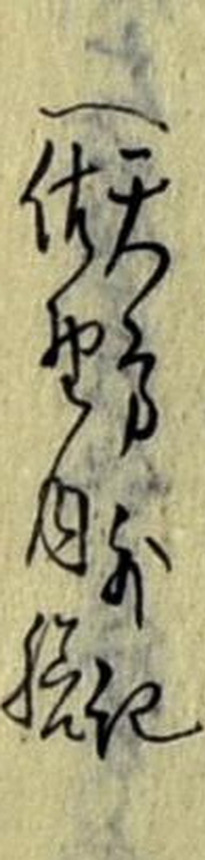佐野内膳
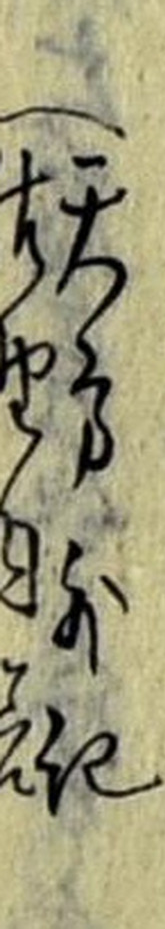佐野内膳

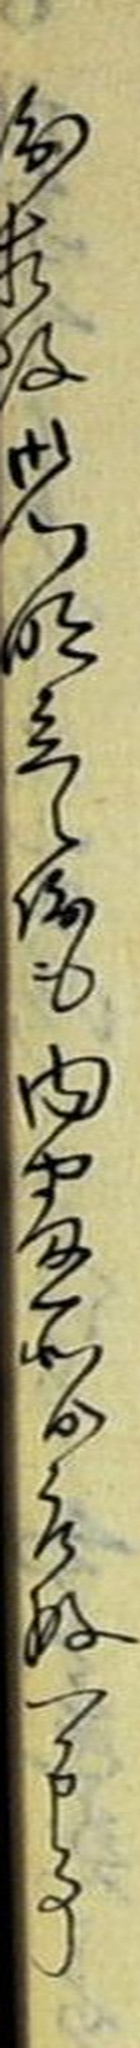儀相改御門明立候儀も内番所ゟ取扱可申事
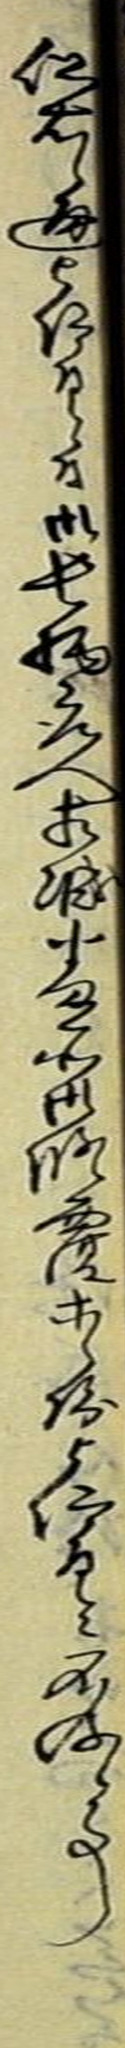但右之通被仰付候ニ付御長柄取人相減番所御修覆等之儀被仰付候ニ不及候事

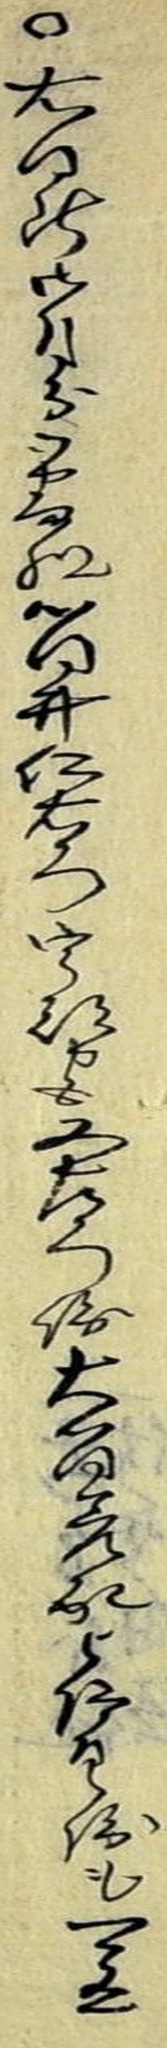〇右同断御自分御番組筒井仁右衛門宇都宮又左衛門儀大筒差配被仰付候儀も可有
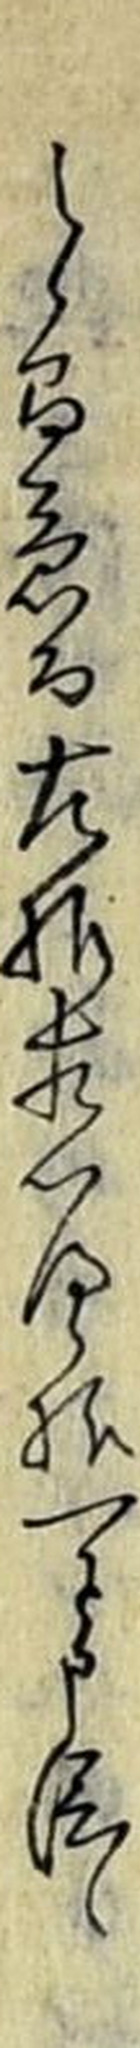之候間兼而左様相心得候様可被申渡候但同断
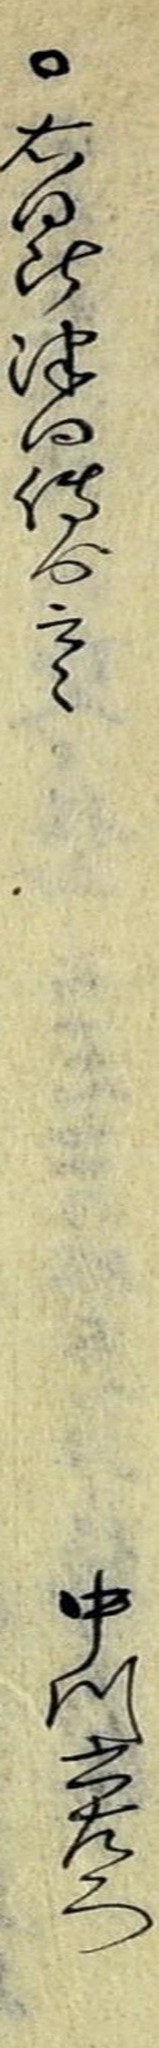〇右同断津田伝右衛門云々中川六左衛門
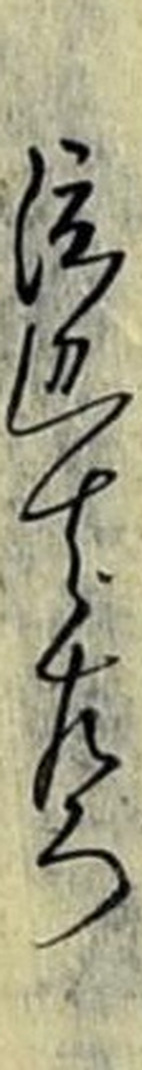渡辺十郎左衛門
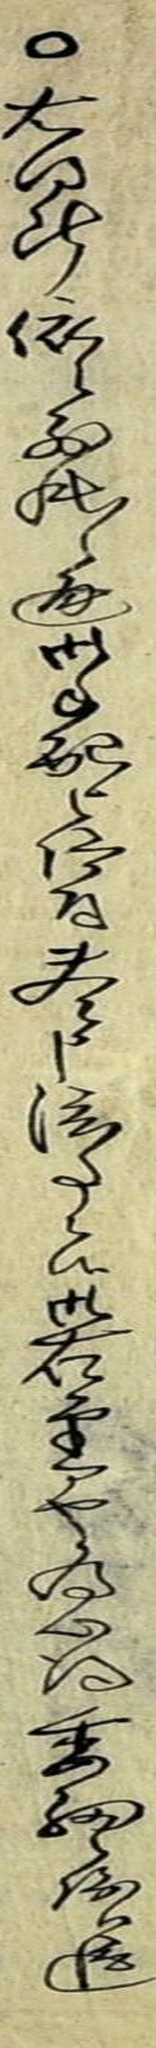〇右同断依之別紙之通御手配被仰付夫々申渡事ニ候御右筆部屋為心得委細之儀ハ追
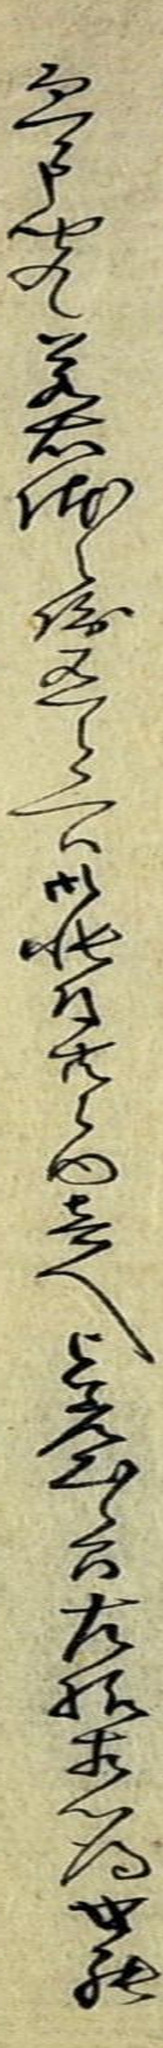而可申聞候若右体之儀有之候ヘハ御帳付共之内壱人被差出候間左様相心得罷
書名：命令之部 三
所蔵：福井県文書館 Fukui Prefectural Archives
